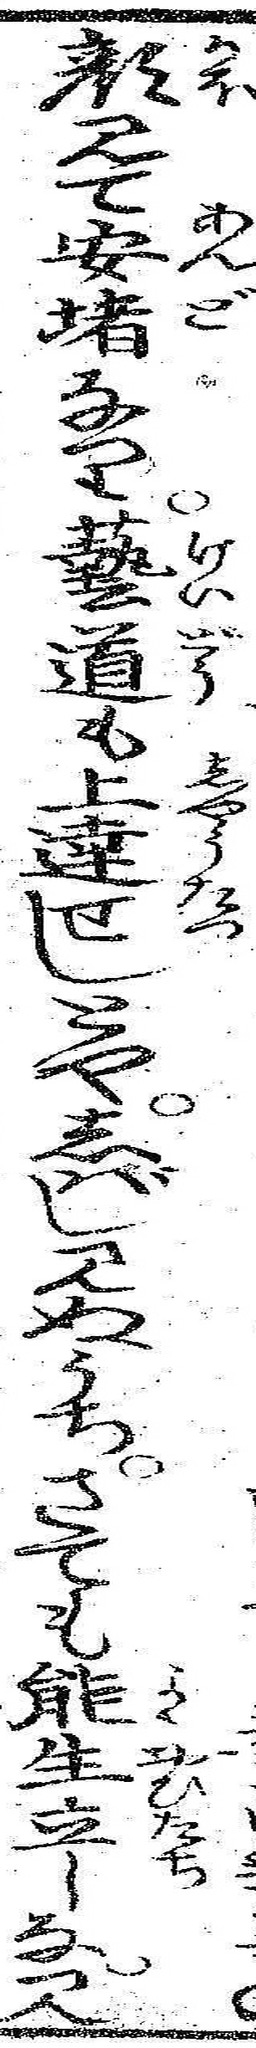顔見て安堵なり。芸道も上達せしとや。しばし見ぬうち。さても能生立しな。見
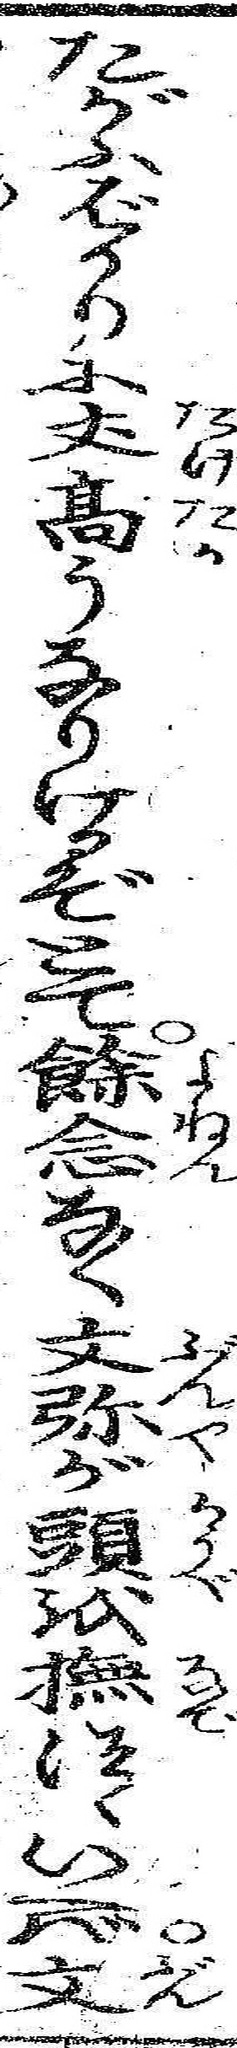たがふばかりに丈高うなりけるぞとて。余念なく文弥が頭を撫つゝいへば。文
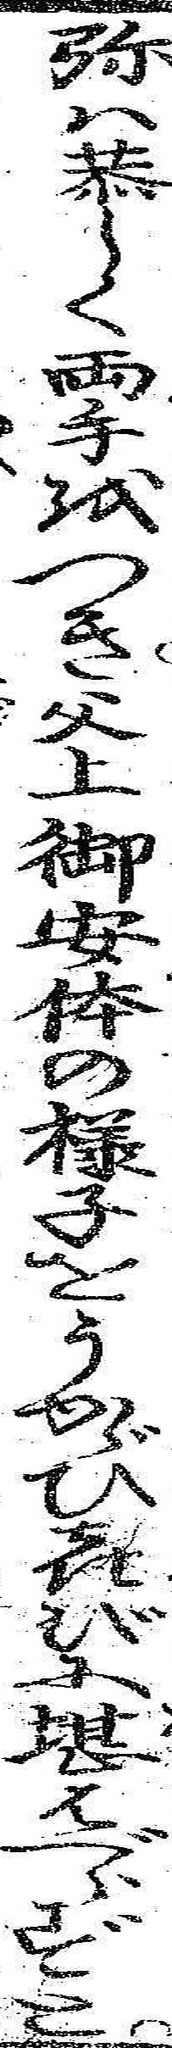弥は恭しく両手をつき。父上御安体の様子をうかゞひ。喜びに堪はべらずと。
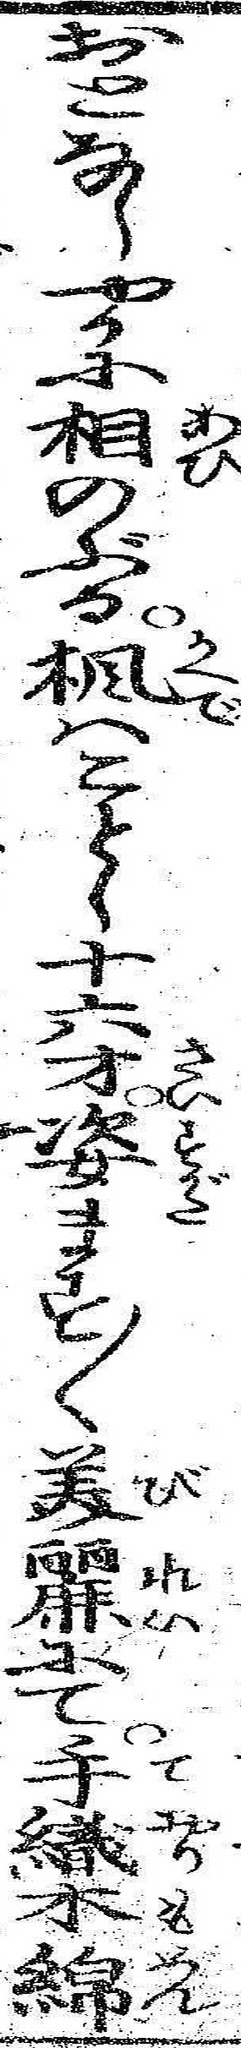おとなしやかに相のぶる。楓はことし十六才。姿ます〳〵美麗にて。手織木綿
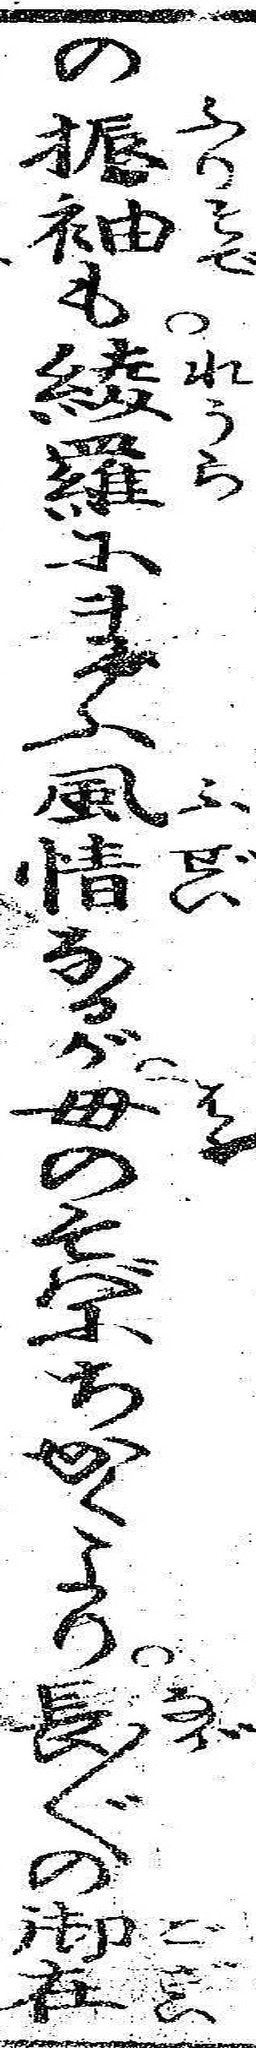の振袖も。綾羅にまかふ風情なるが。母のそばにちかくより。長〴〵の御在
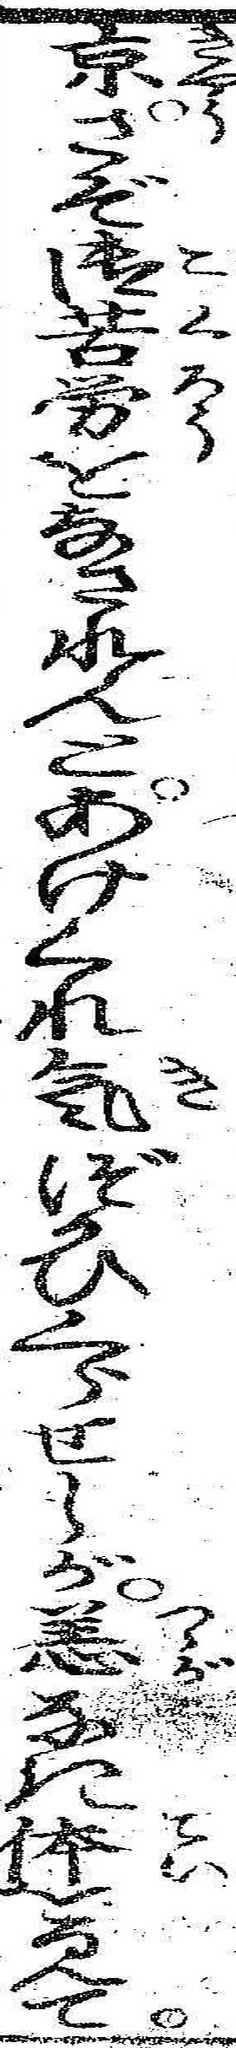京。さぞ御苦労をなされんと。あけくれ気づかひくらせしが。恙なき体を見て。

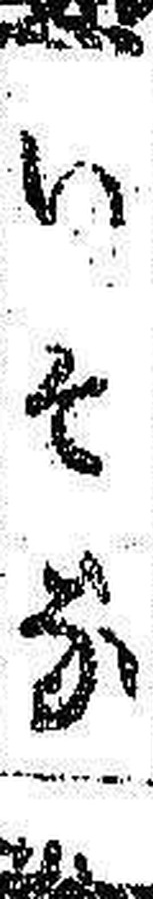いそな
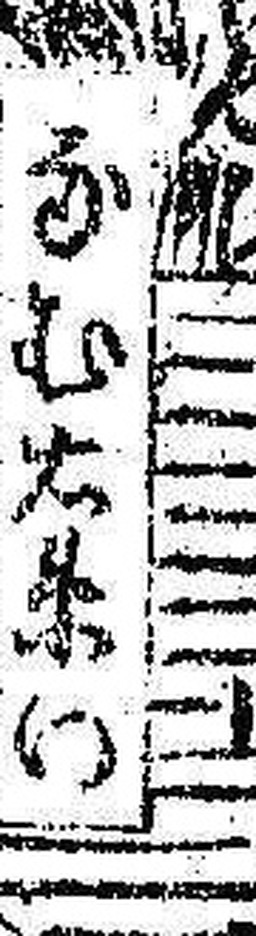なむ右衛門
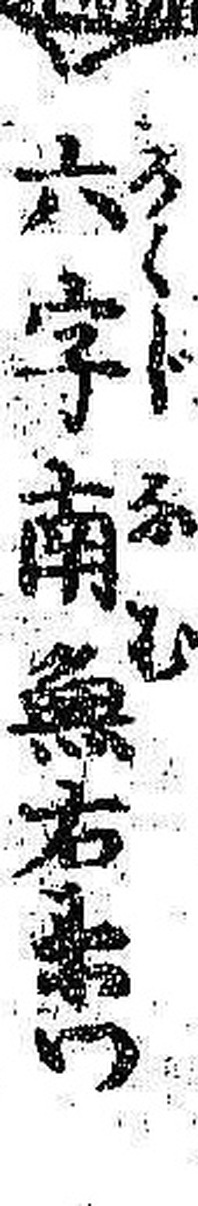六字南無右衛門
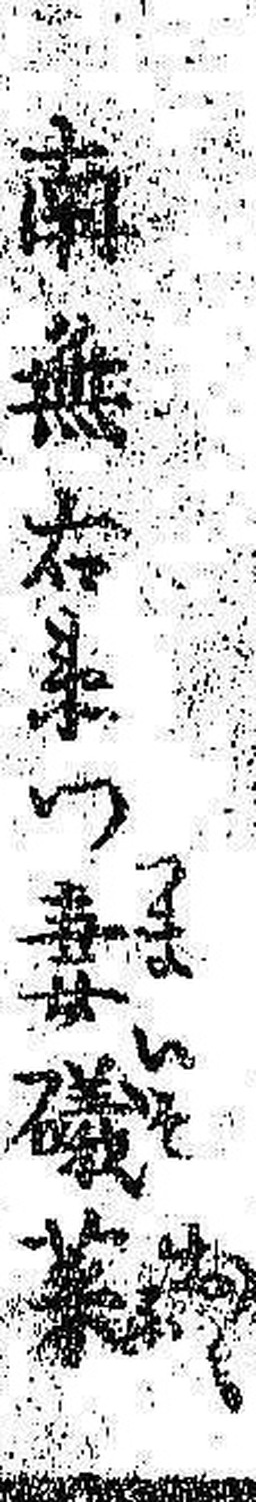南無右衛門は妻礒菜
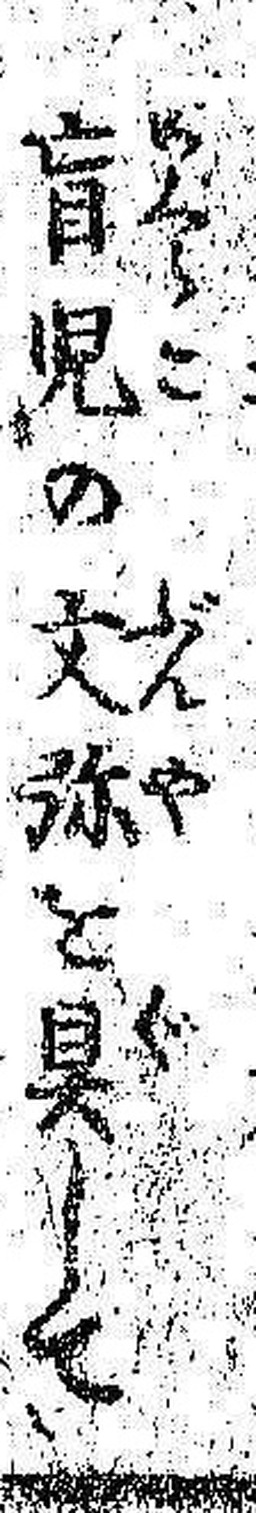盲児の文弥を具して
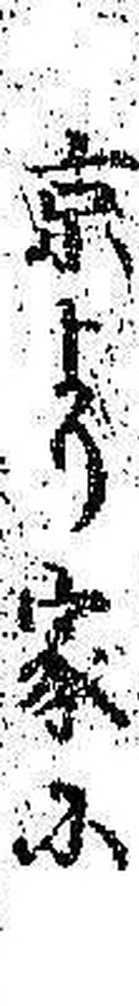京より家に
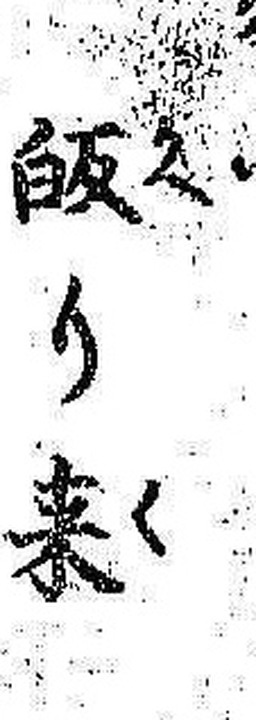帰り来

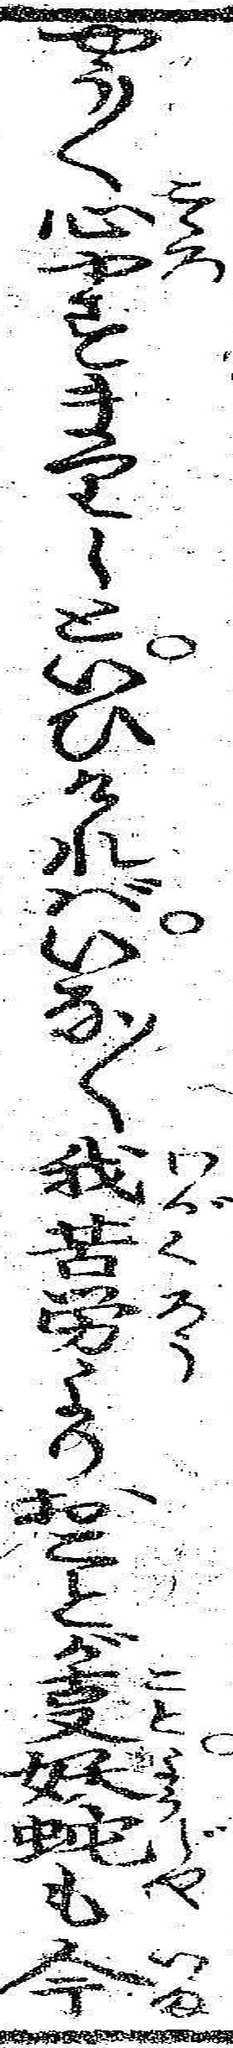やう〳〵心やすまりしと。いひければ。いな〳〵我苦労よりおことが事。妖蛇も今
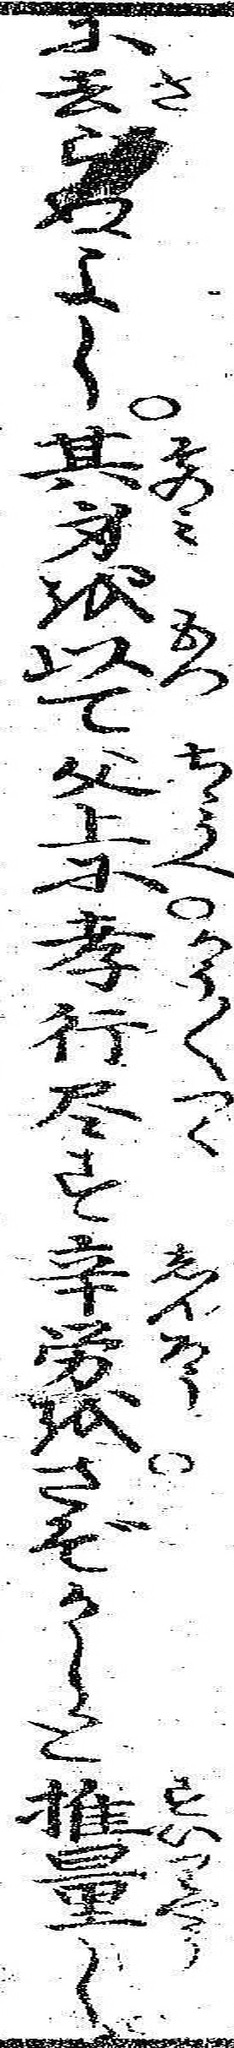に去らぬよし。其身を以て父上に。孝行尽す辛労を。さぞかしと推量し。
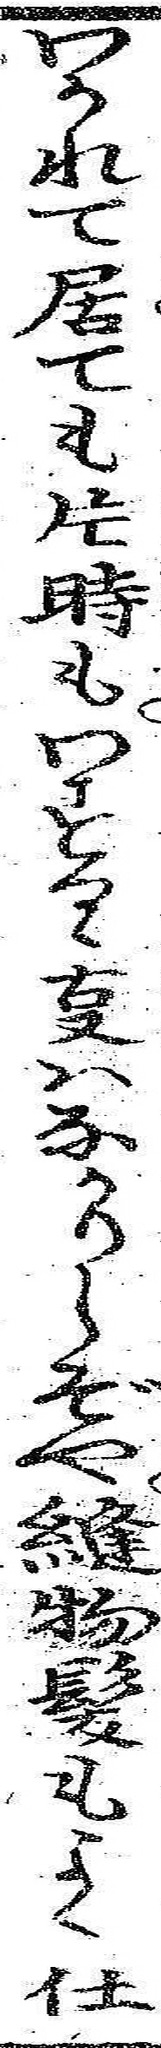わかれて居ても片時も。わするゝ事はなかりしぞや。縫物髪もよく仕
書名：昔話稲妻表紙
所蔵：国文学研究資料館
